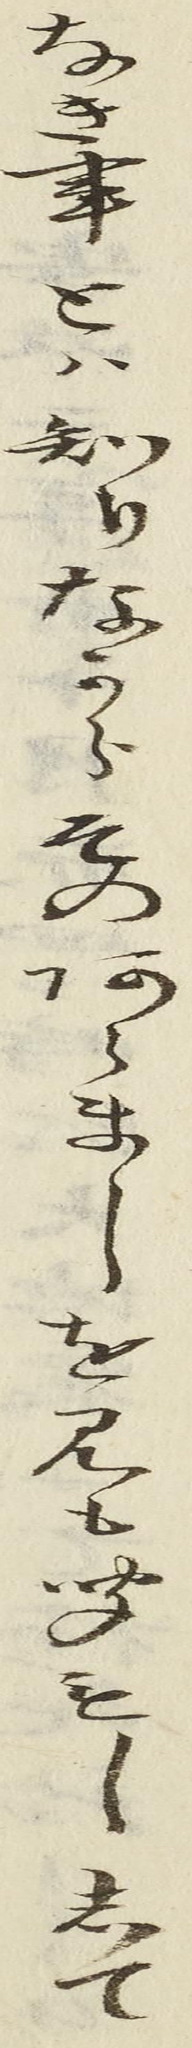なき事とハ知りなからそのあらましを見も聞もしして
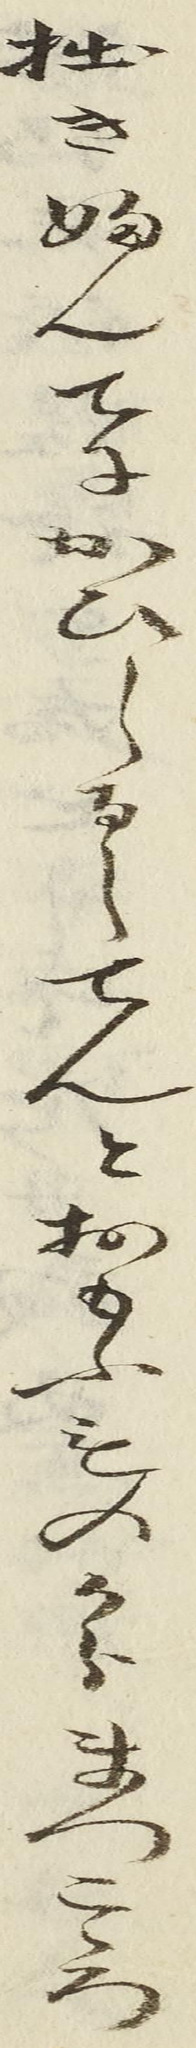拙きふんてにかひしるしてんとおもふものからまつこゝろ
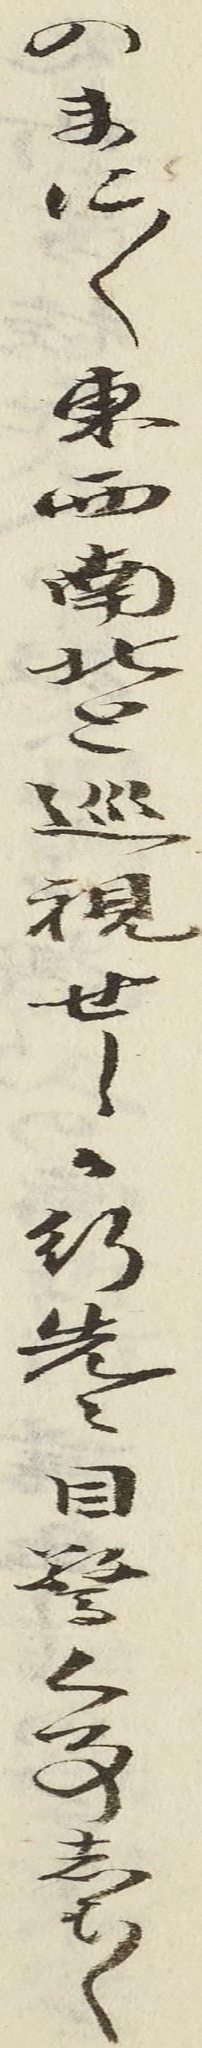のまに〳〵東西南北と巡視せしか行先々目驚く事しは〳〵
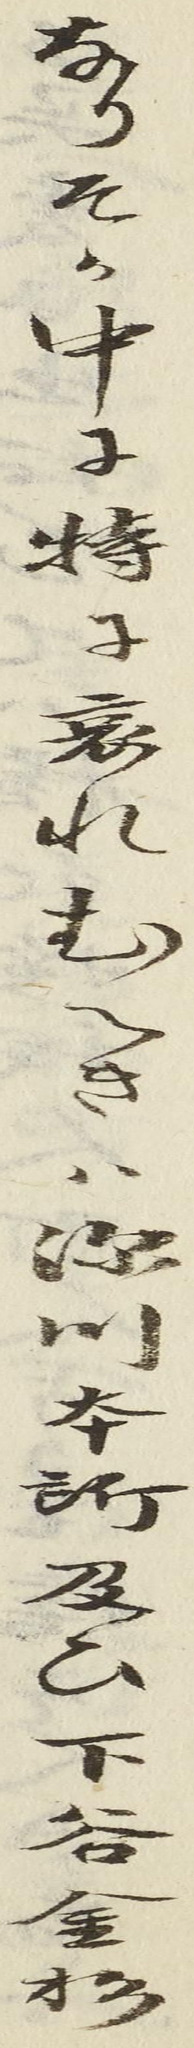なりそか中に特に哀れむへきハ深川本所及ひ下谷金杉
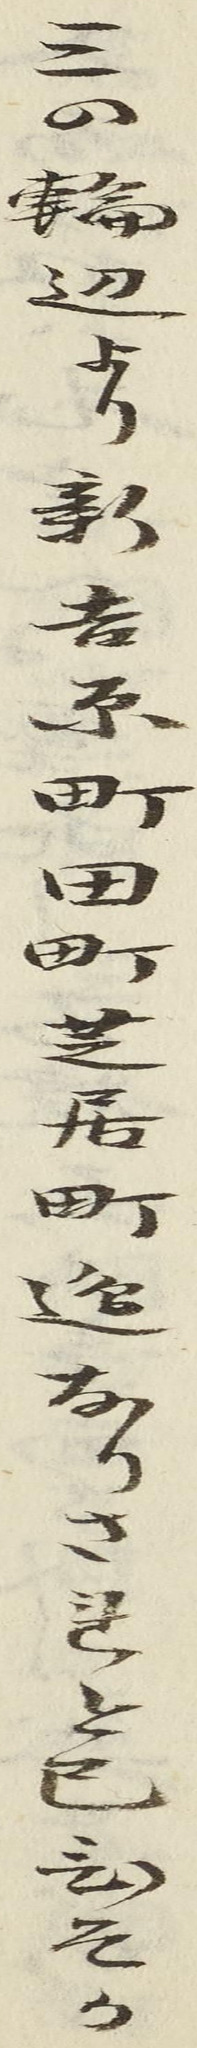三の輪より新吉原町田町芝居町辺なりされと己ひそか
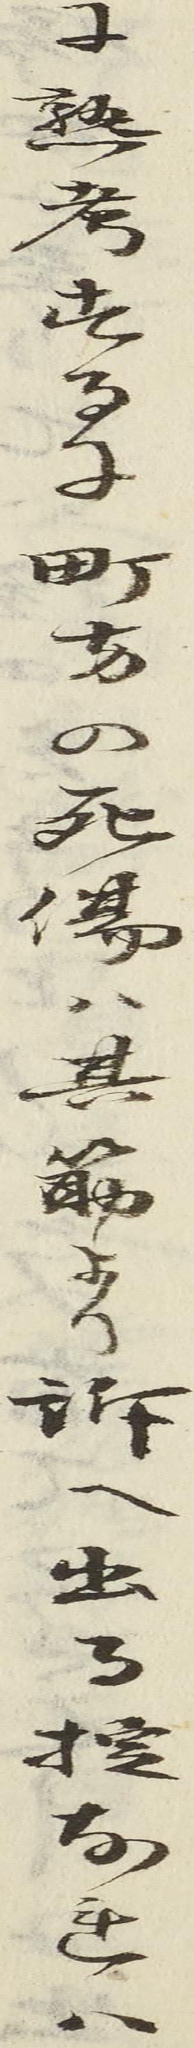に熟考するに町方の死傷ハ其筋より訴へ出る掟なれハ
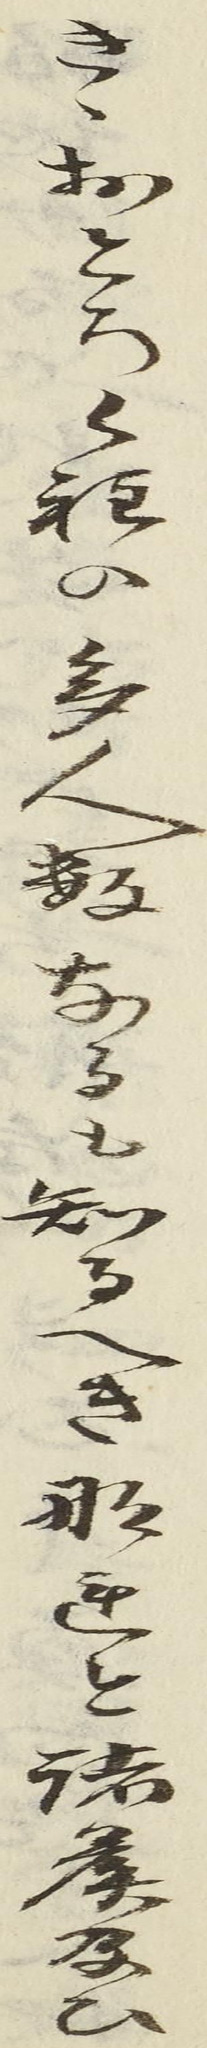きゝおとろく程の多人数なるも知るへきなれと諸矦及ひ
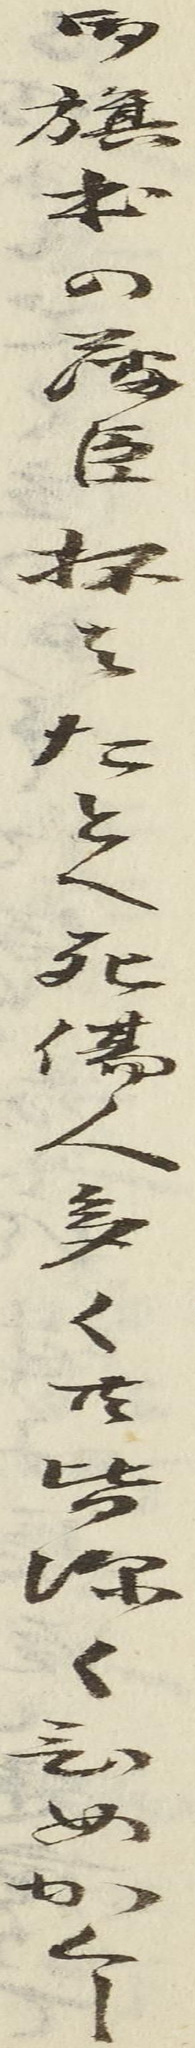御旗本の藩臣抔はたとへ死傷人多く共皆深くひめかくし
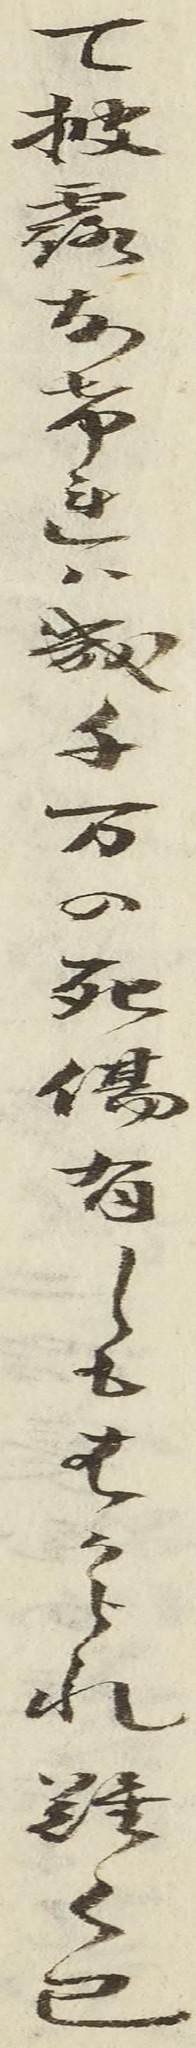て披露なけれハ幾千万の死傷有しもはかられ難く己
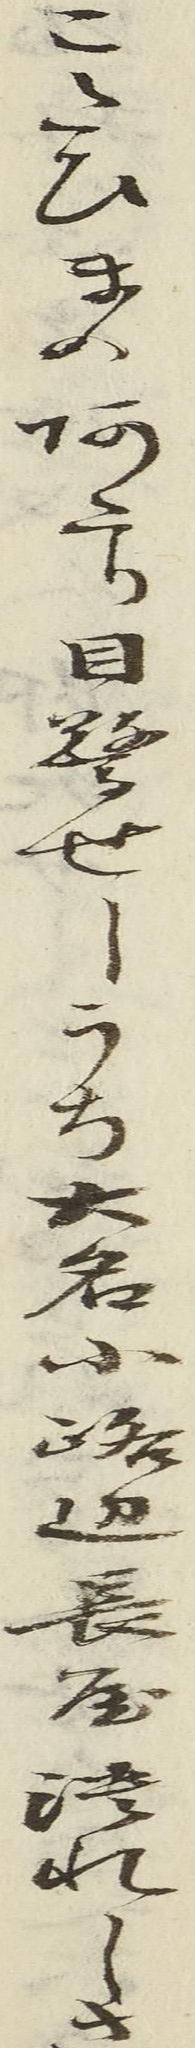こたひまのあたり目驚せしうち大名小路辺長屋潰れしさ

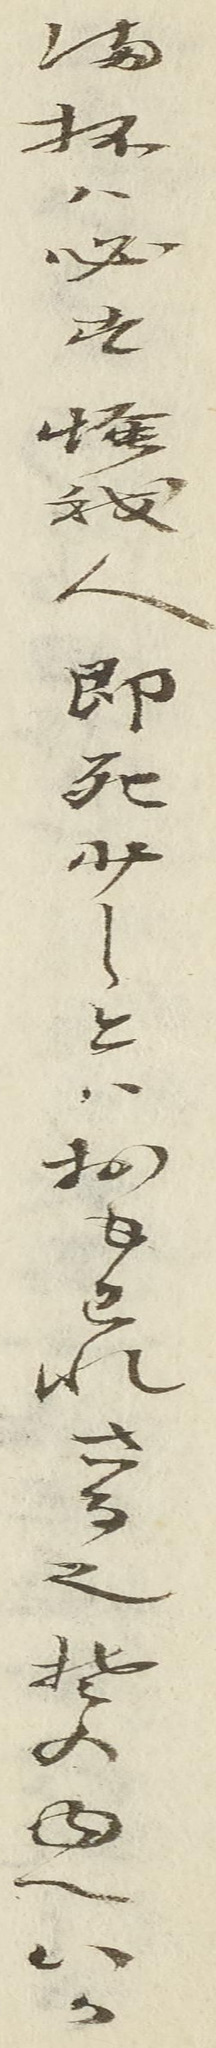ま抔ハ必す怪我人即死少しとハおもわれさる也そのゆへいか
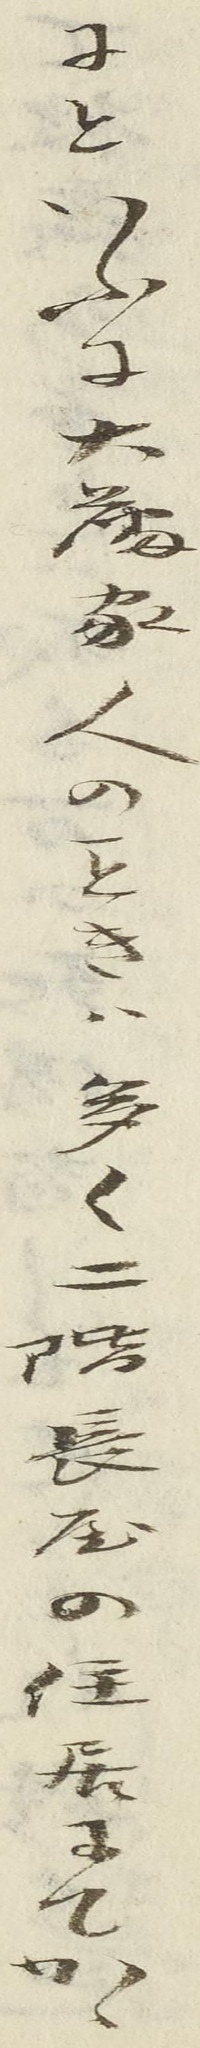にといふに大藩家人のこときハ多く二階長屋の住居にてかゝ
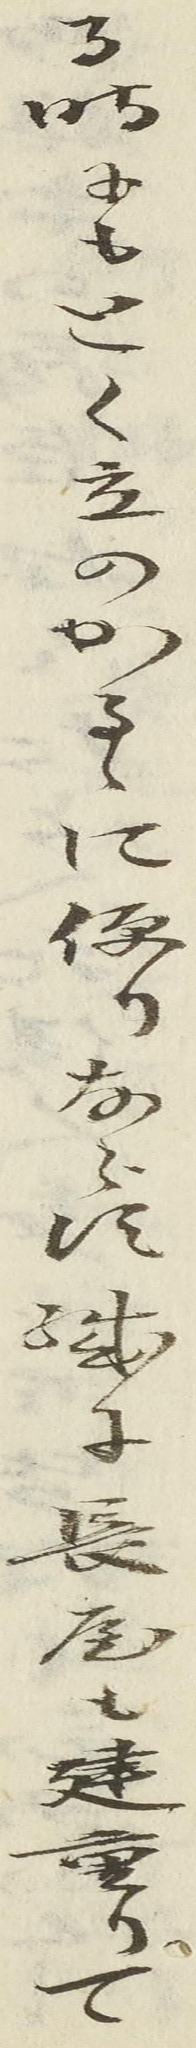る時にもとく立のかるゝに便りならす殊に長屋も建重りて
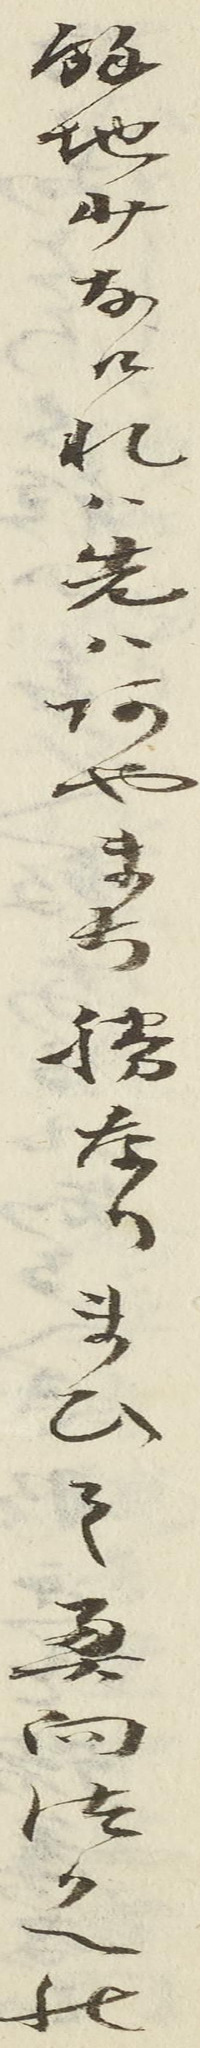余地少なけれハ先ハあやまち勝なりまひて奥向つかへの
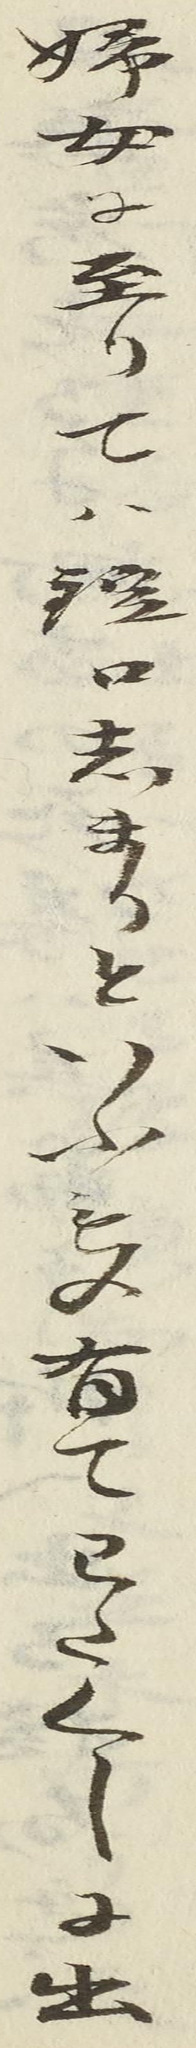婦女に至りてハ錠口しまりといふもの有てわたくしに出
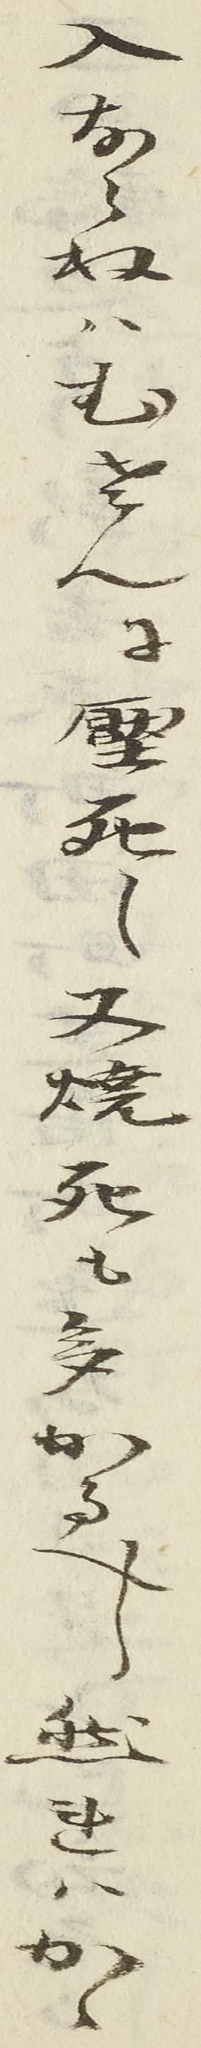入ならねハむさんに圧死し又焼死も多かるへし然れハかゝ
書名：那為の後見艸　全
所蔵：東京大学地震研究所図書室 Earthquake Research Institute Library, The University of Tokyo, JAPAN
